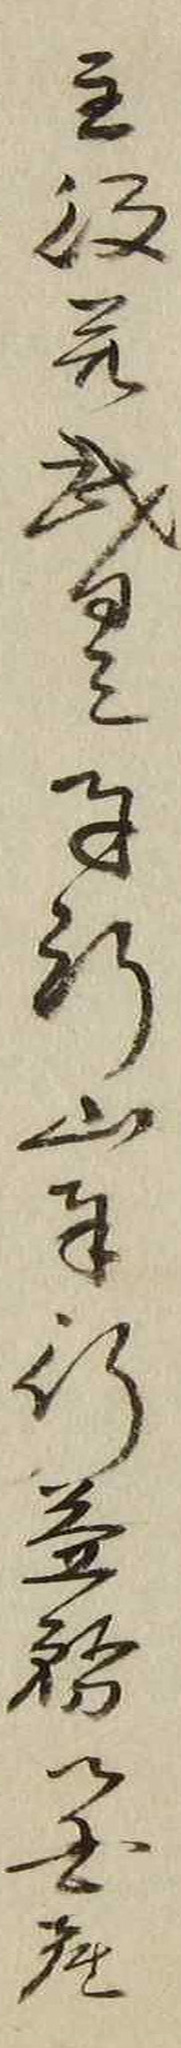主役并武具奉行山奉行兼務御国産
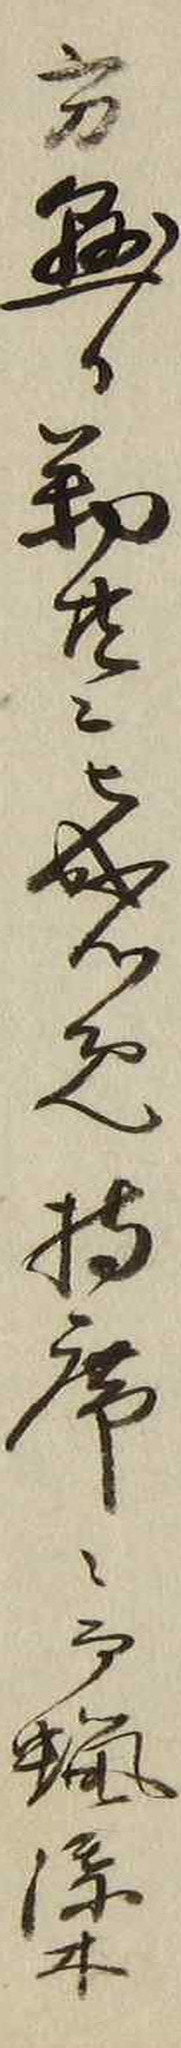方懸り勤共ニ被成御免持席ニ而蝋漆木
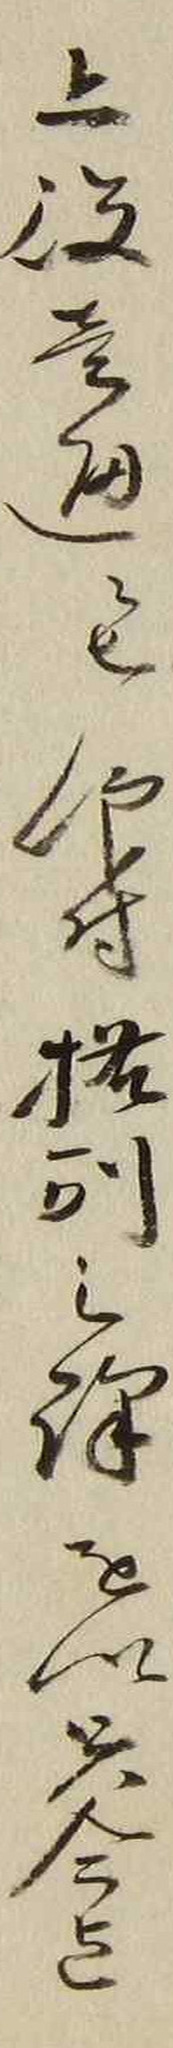上役壱通ニ被仰付格別之訳を以只今迄
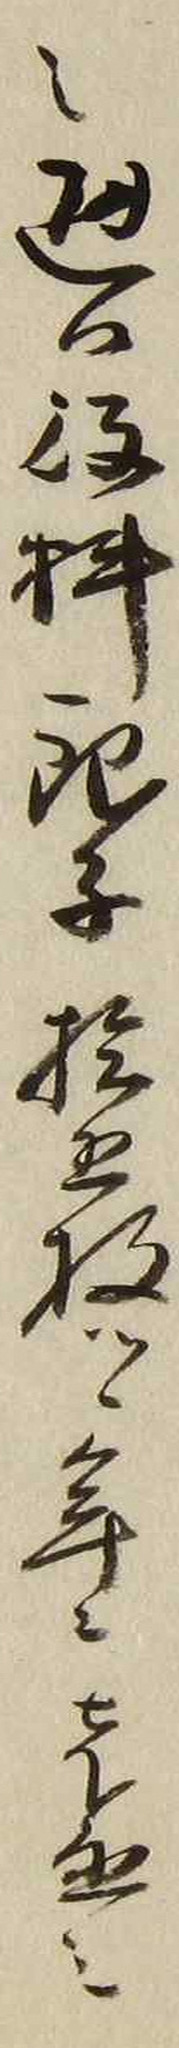之通御役料銀子拾五枚ツヽ年々被下置之
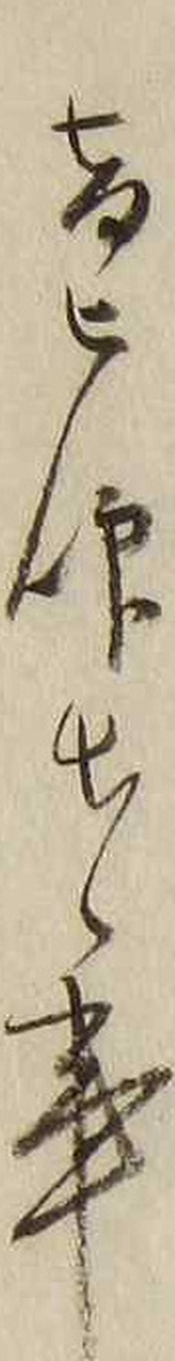旨被仰出候事

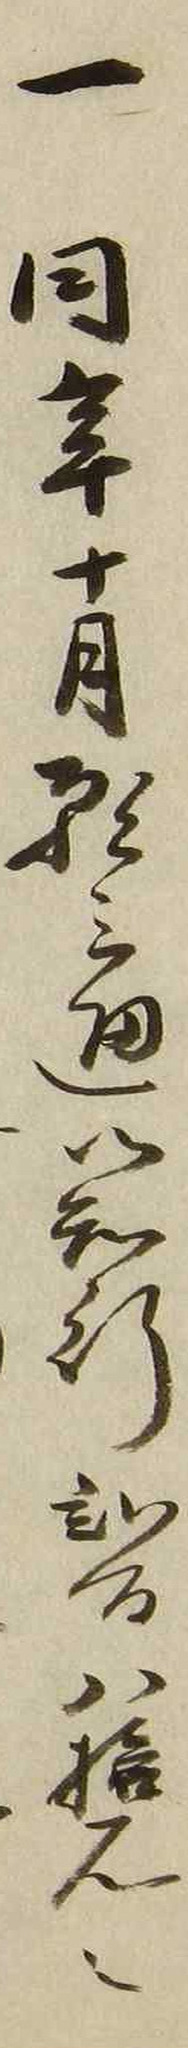一同年十月願之通御知行弐百八拾石之
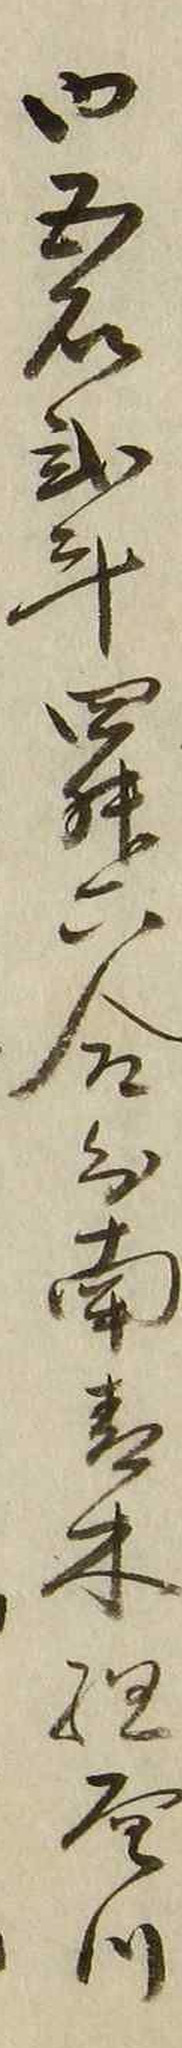内五石弐斗四升六合分南青木組面川
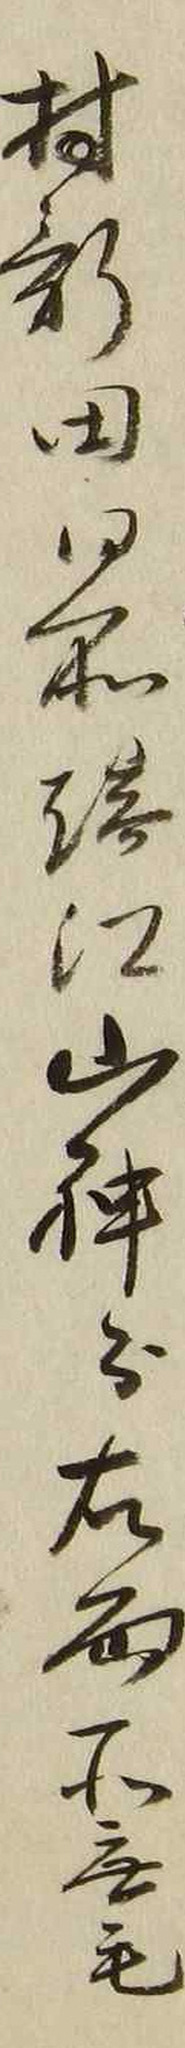村新田同所端郷山神分右面所無毛
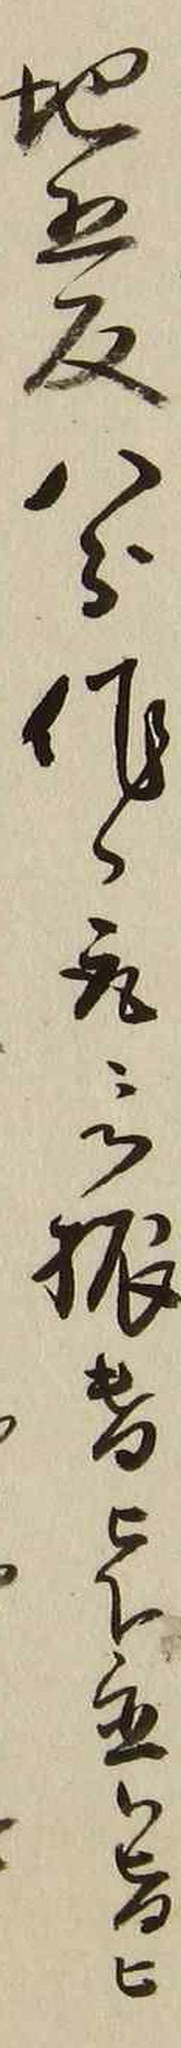地五反八分作り取立ニ御振替被下置候旨被
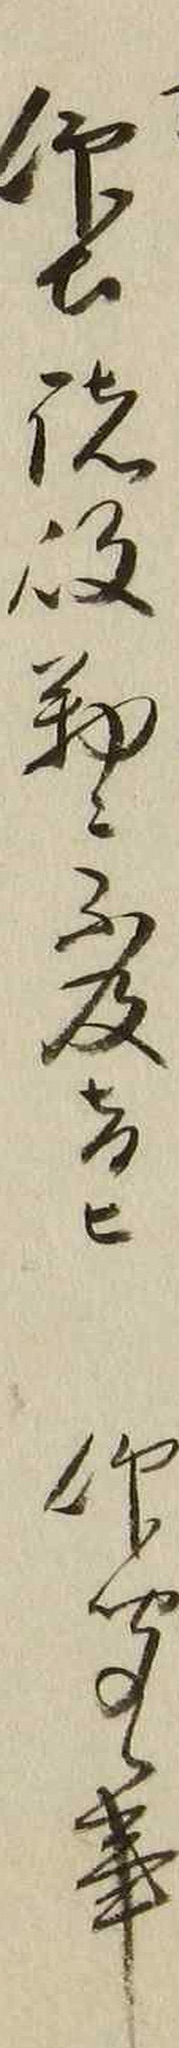仰出諸役勤ニ不及旨被仰聞候事
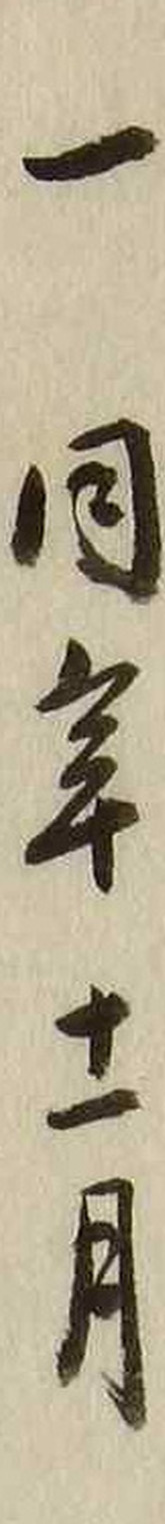一同年十一月
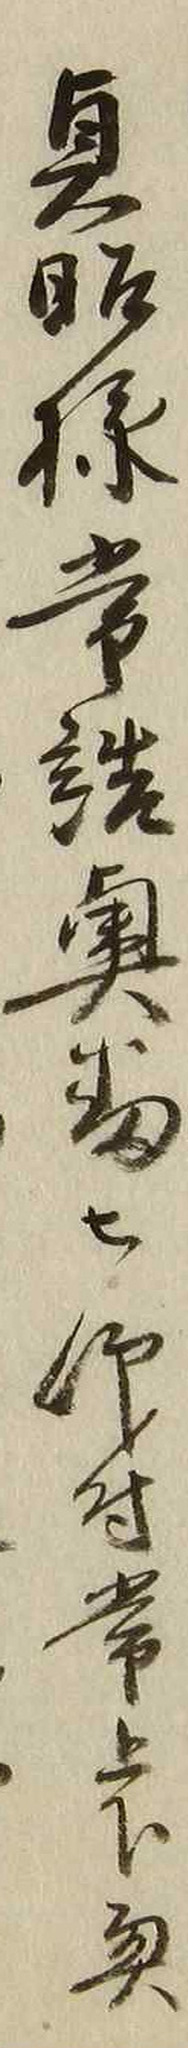貞昭様常詰奥番被仰付常上下奥
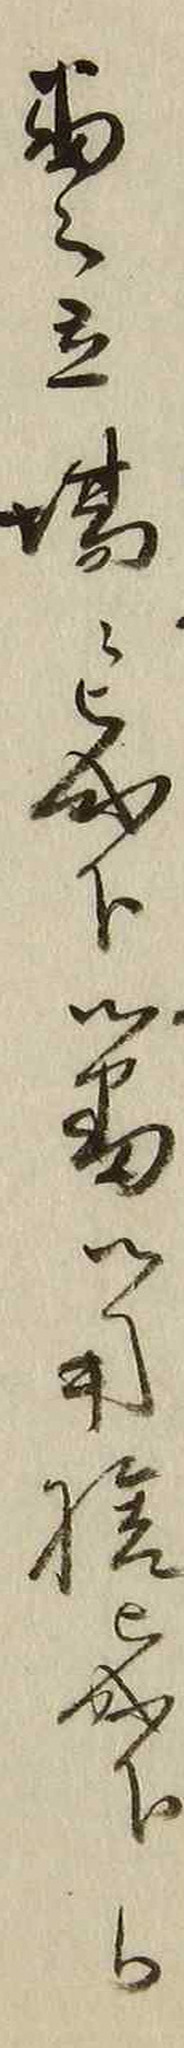番之立場ニ被成下御番御用捨被成候
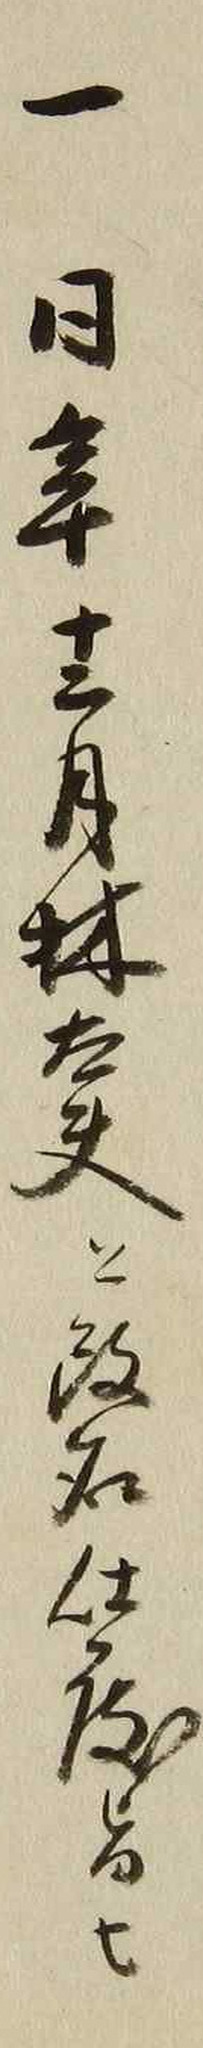一同年十二月林太夫と改名仕度旨被
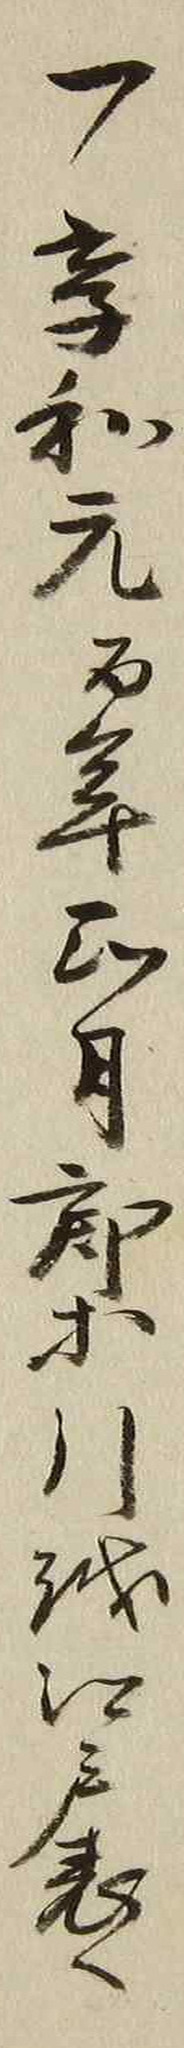一享和元酉年正月郎等引越江戸表へ
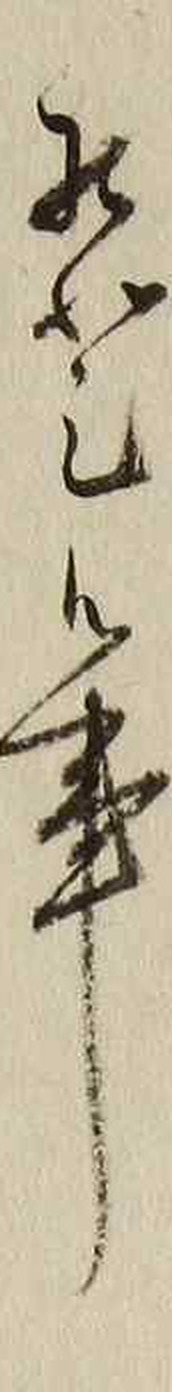罷登候事
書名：諸士系譜　巻之311　し之部1
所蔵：会津若松市立会津図書館
